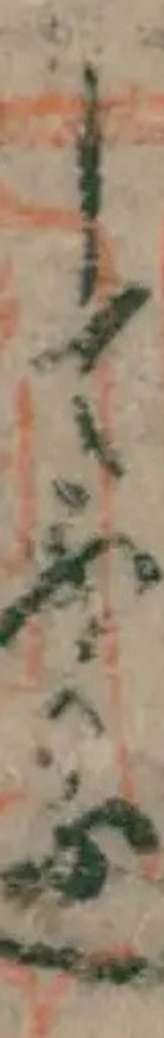してふうふ
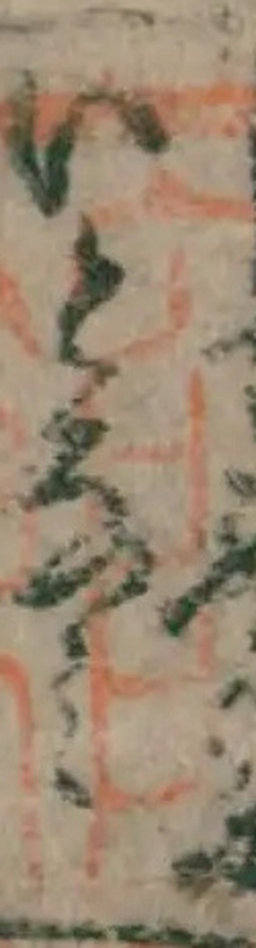いとなみ

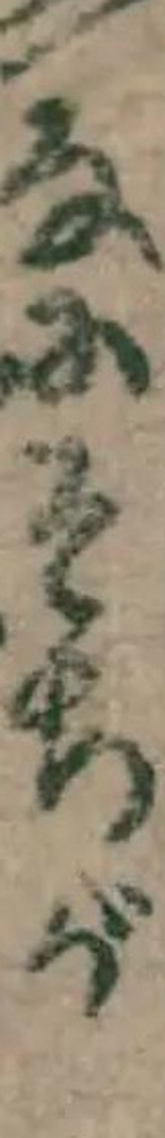なにそちが
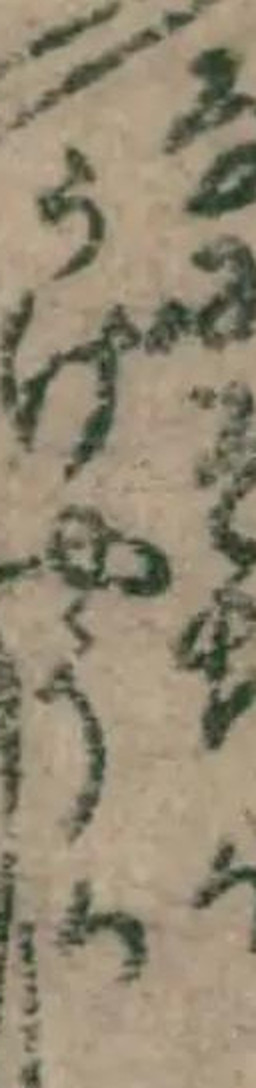うけやうか
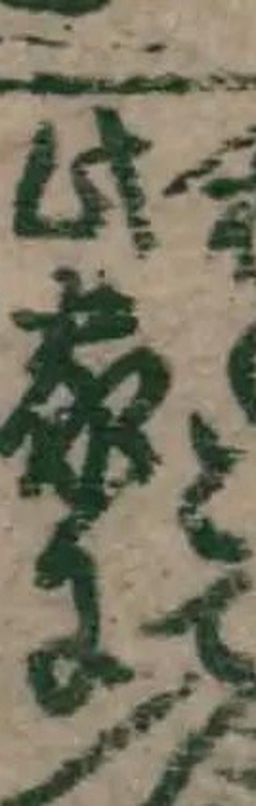此家に
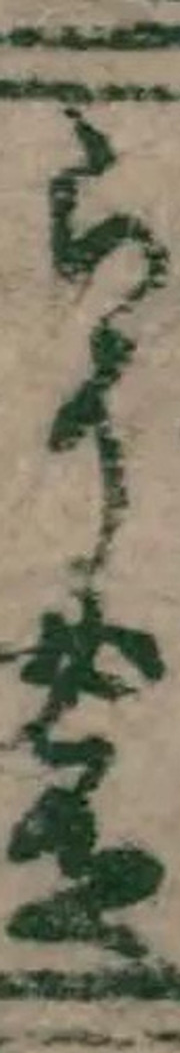らう女有
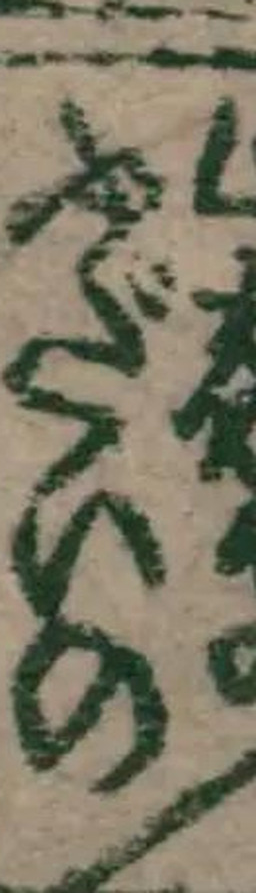ふだいの
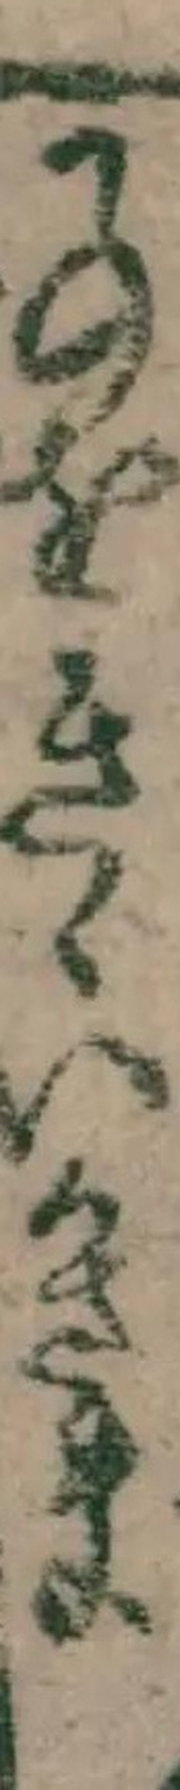事をきゝいかさま
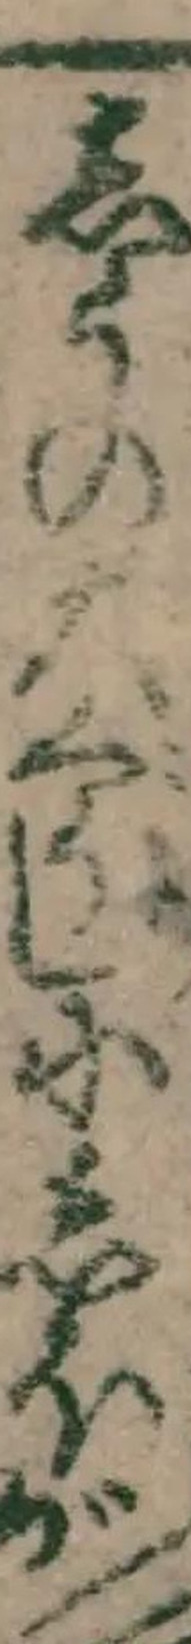しうの大ぐうし小しほが
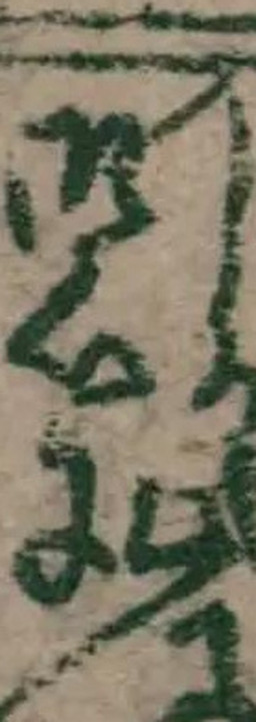御心に
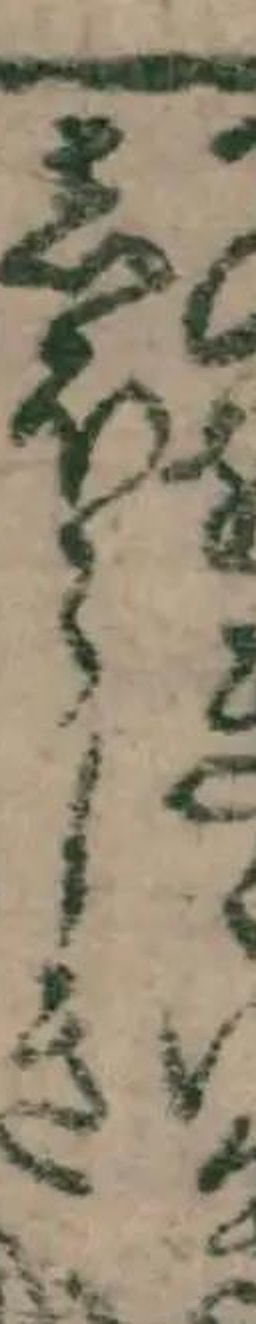しほらしき
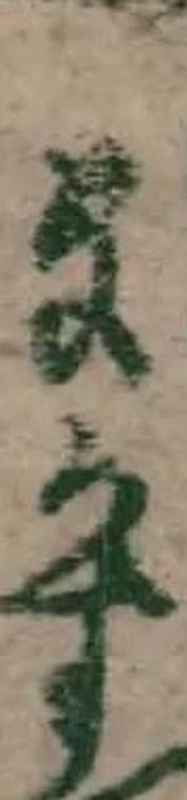まかす
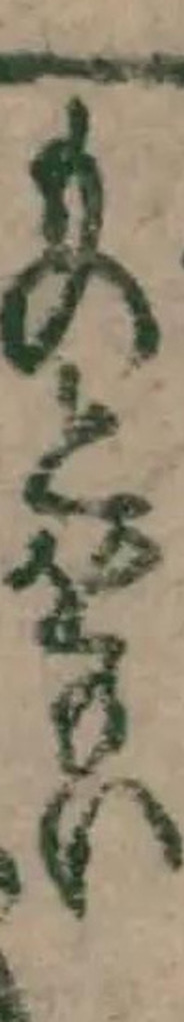ものとおもい
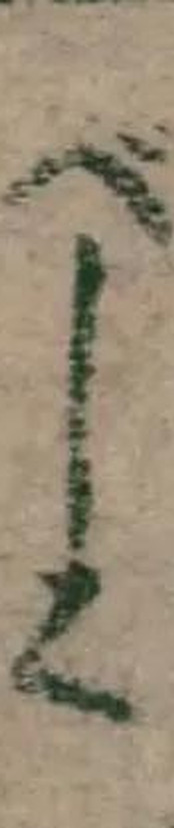べしと
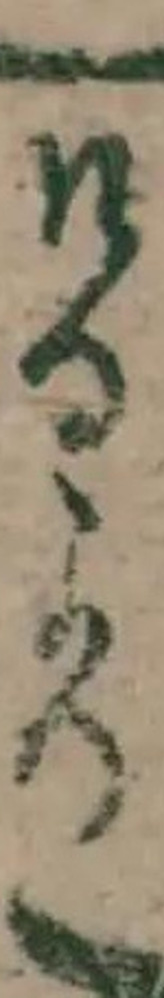けるより
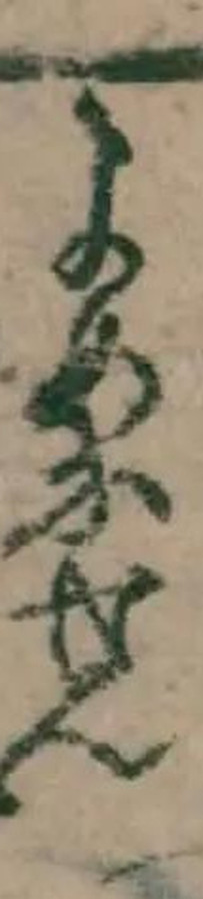よめにせん
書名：塩売文太物語 2巻
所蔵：国立国会図書館 National Diet Library, JAPAN
